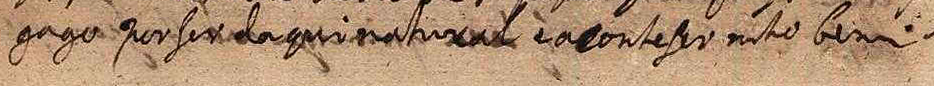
gago por ser daqui natural e a conheser mto bem.
